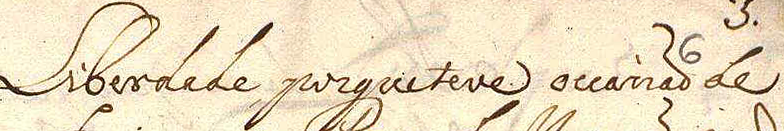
Liberdade, porque teve occaziaõ de
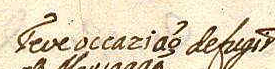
Teve occaziaõ de fugir
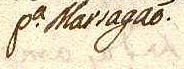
p.a Marsagaõ.
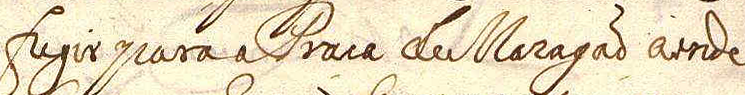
fugir para a Praça de Mazagaõ aonde
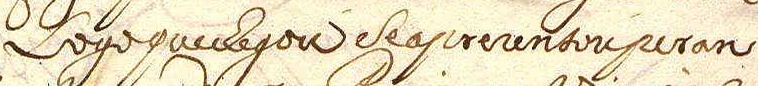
Logo que chegou se aprezentou peran
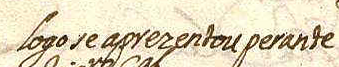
logo se aprezentou perante
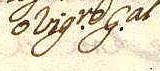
o Vig.r.o G.al
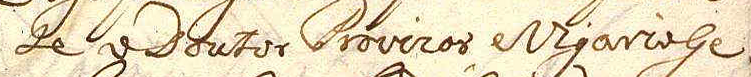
te o Doutor Provizor e Vigario Ge
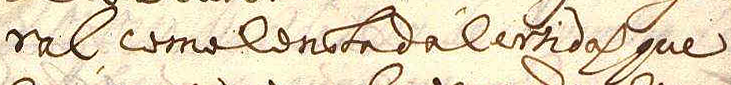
ral, como Consta da Certidaõ que
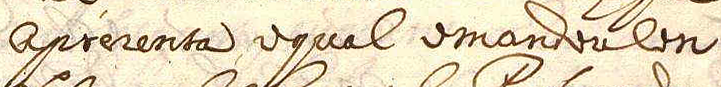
aprezenta, o qual o mandou Con
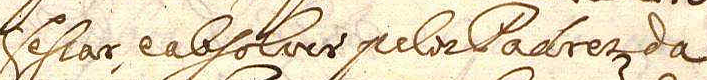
fessar, e absolver pelos Padrez da
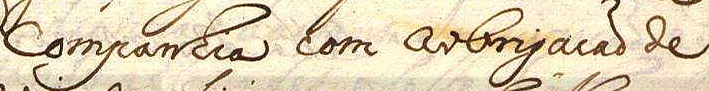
Companhia com a obrigaçaõ de
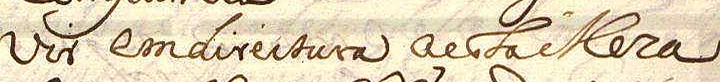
vir em direitura a esta Meza
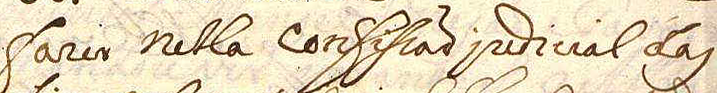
fazer nella confissaõ judicial das
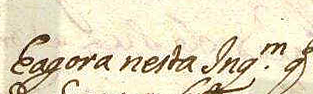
E agora nesta Inq.am q.to
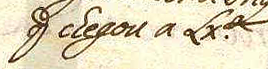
q̄ chegou a Lx.a
